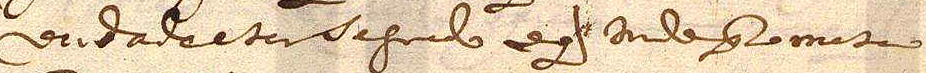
verdade e ter segredo o q̄ tudo prometeo
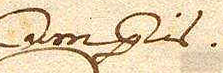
Cumprir.
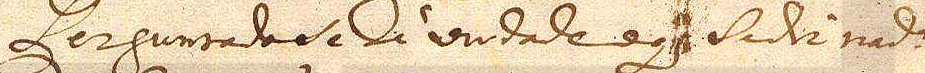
Perguntada se hé verdade o q̄ se diz na da
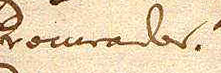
Procurador?
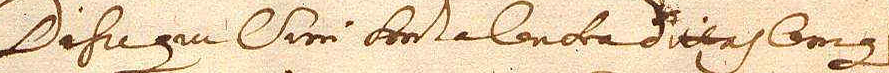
Disse que Sim tinha Contradittas com q̄
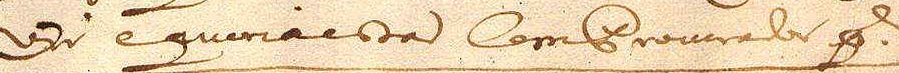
vir e queria esta Com Procurador p.a
